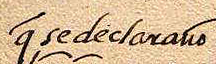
q̄ se declarauō
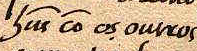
hūs cō os outros
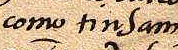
como tinham
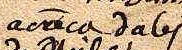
a crēça da lej
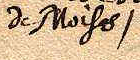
de Moises /
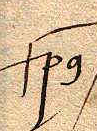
tp̄ꝯ /
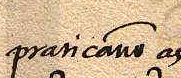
praticauō as
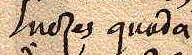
uezes quada
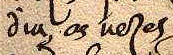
dia, as uezes
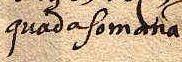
quada somana
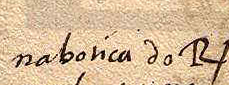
na botica do R
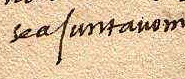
se aJuntauom
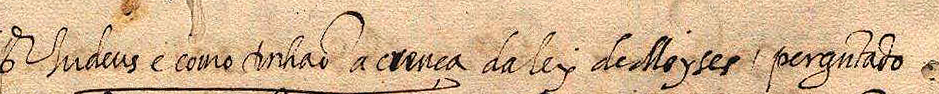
por Iudeus e como tinhaõ a crença da ley de Moyses, pergūtado
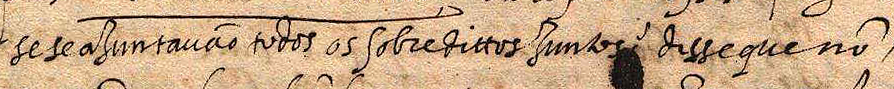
se se aJuntauão todos os sobredittos Juntos? disse que nō /
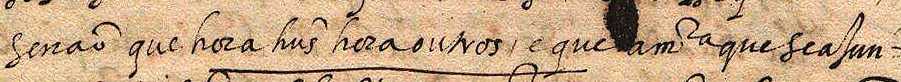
senaõ que hora hūs hera outros, e que a mra que se aJun
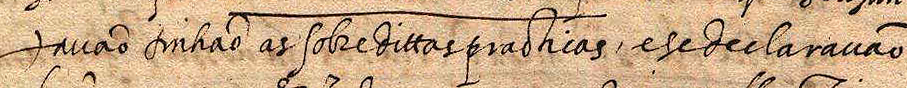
tauaõ tinhaõ as sobredittas practicas, e se declarauaõ
